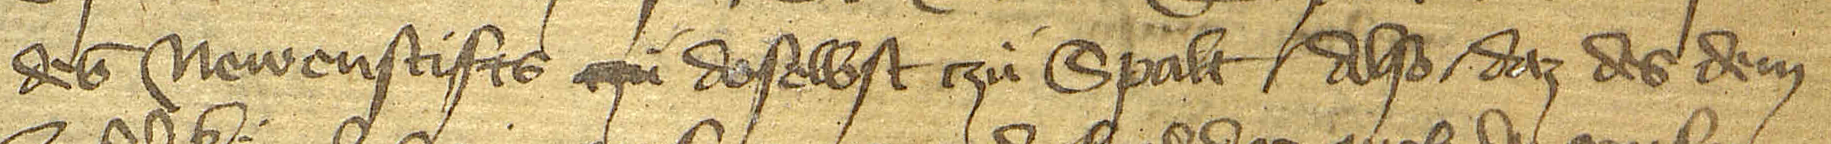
des Newenſtifts cʒü doſelbst cʒü Spalt / Alſo / daʒ des dem
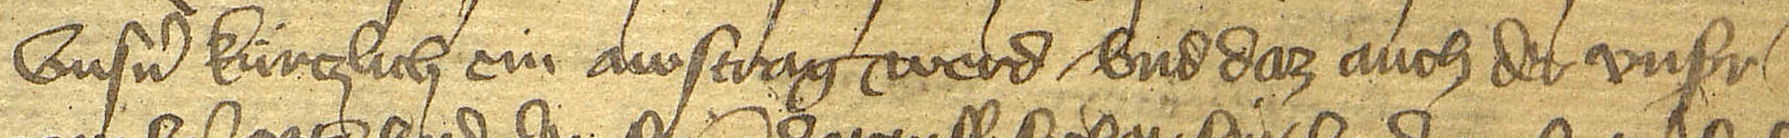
vnſn* kürcʒlich ein awſtrag werd / vnd daʒ auch der vnſ*r
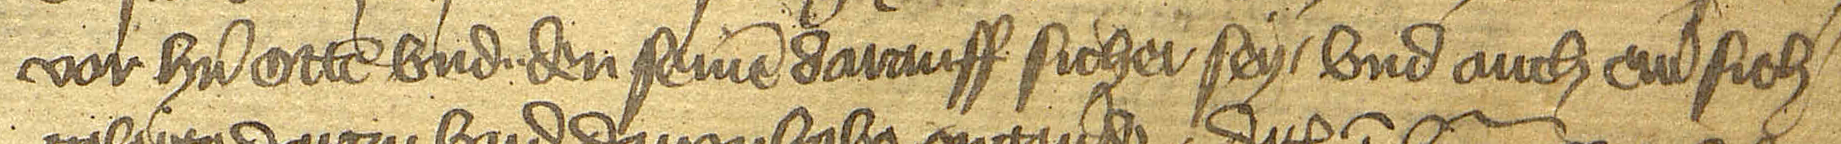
vor hn* Otte* vnd ~ den ſeine* darauff ſicher ſey / vnd auch ew* ſich*
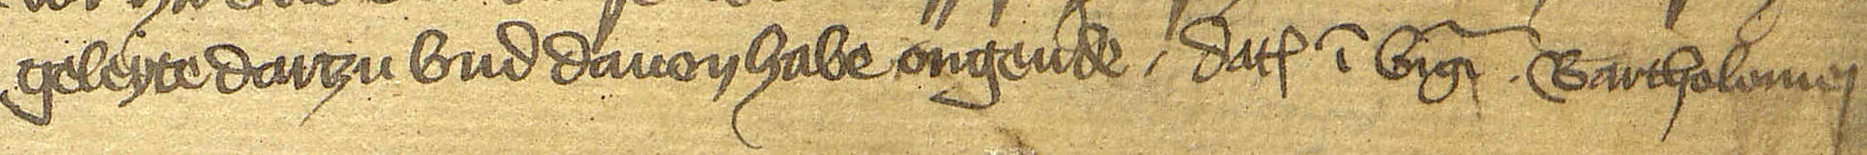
geleyte darcʒu vnd dauon habe ongeu*de / Dat* i* vigi* Bartholomei
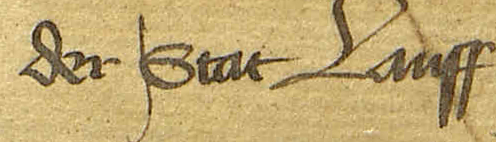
der Stat Lauff
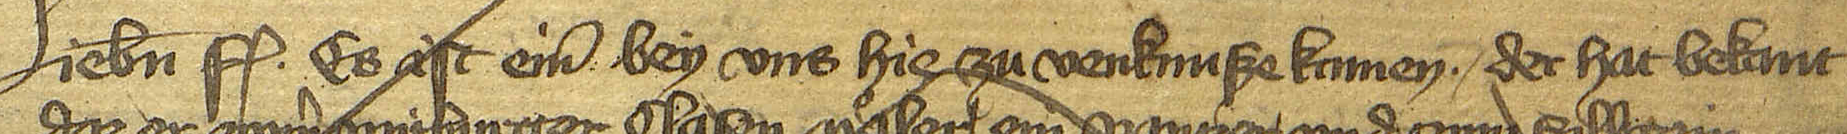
Liebn* fr* . Es iſt ein* bey vns hie cʒu vnknuſʒe kumen . / der hat bekant
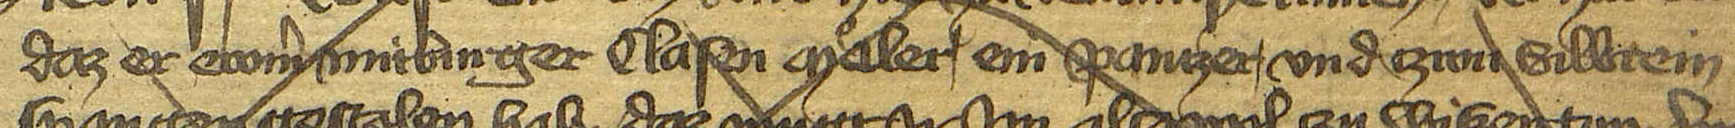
daʒ er ewm* mitburger Claſen Mäler ein Pancʒer vnd cʒu Silbrein
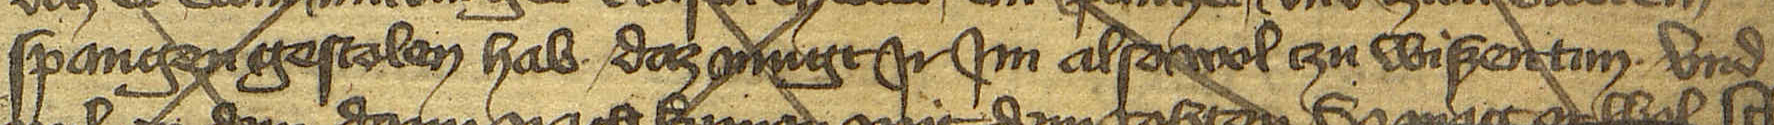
ſpangen geſtolen hab . daʒ mugt Ir Im alſo wol cʒu wiſʒen tun . / Vnd
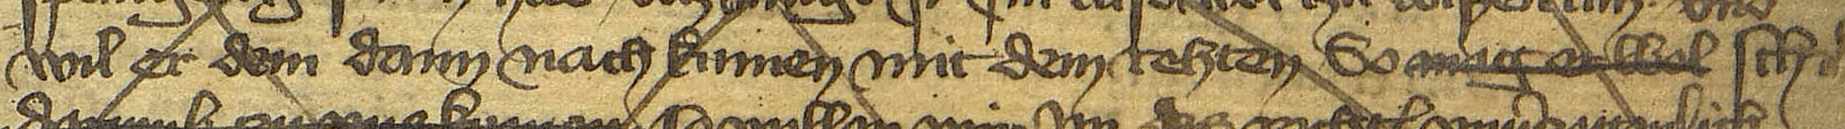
wil der dem dann nach kumen mit dem rehten So mag er wol ſchi
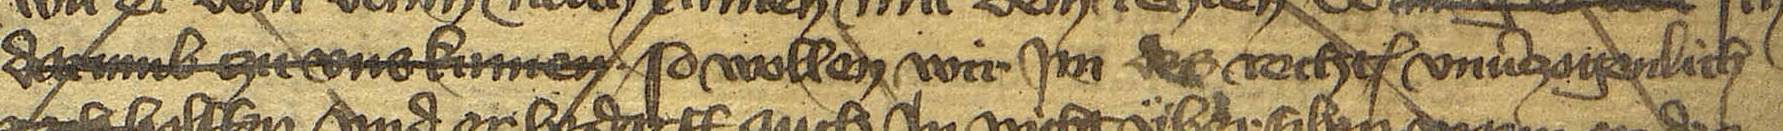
darumb cʒu vns kumen . / ſo wollen wir Im des recht* vnu*cʒogenlich
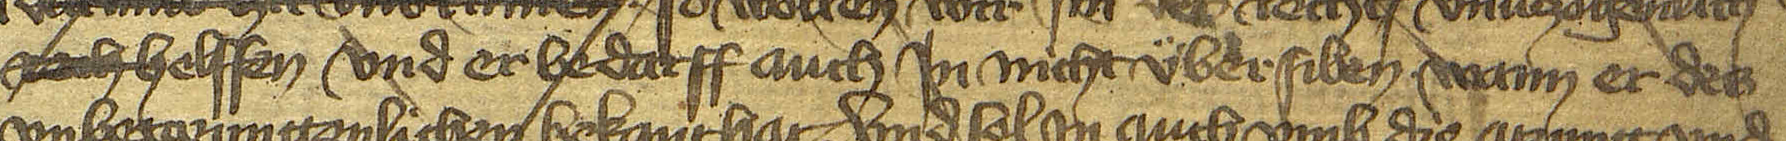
rech helffen / vnd er bedarf auch In nicht v̈berſiben wann er des
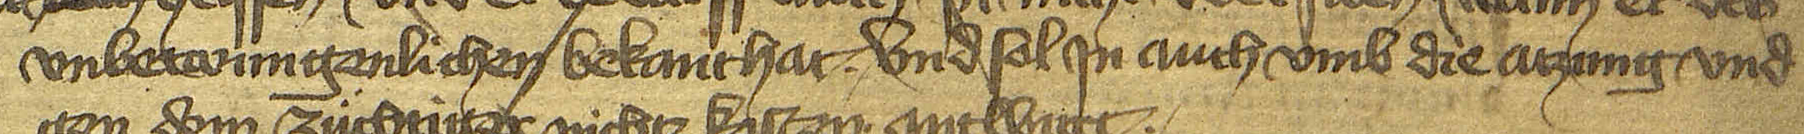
vnbetwingenlichen bekant hat . Vnd ſol In auch vmb die acʒung vnd
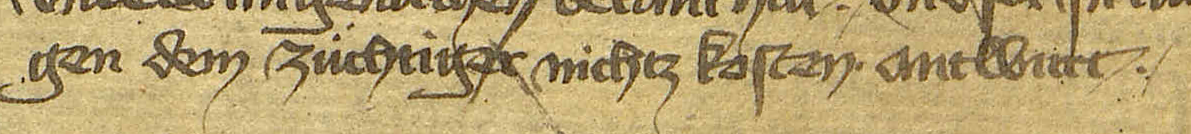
gen dem cʒüchtiger nichtʒ koſten . antwurt . /
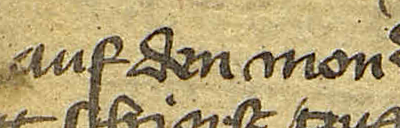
auf den mon
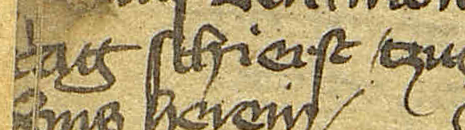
tag ſchierſt / cʒu
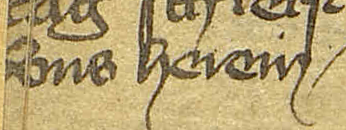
vns herein /
